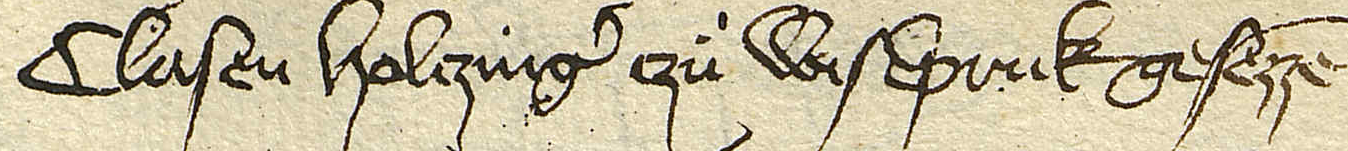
Claſen Holcʒing* cʒü Wiſe*pruk geſeʒʒe*
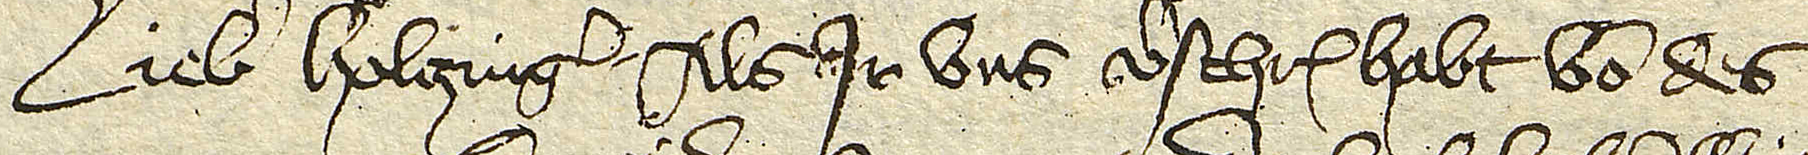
Lieb* holcʒing* / Als Ir vns v*ſchr* habt vo* des
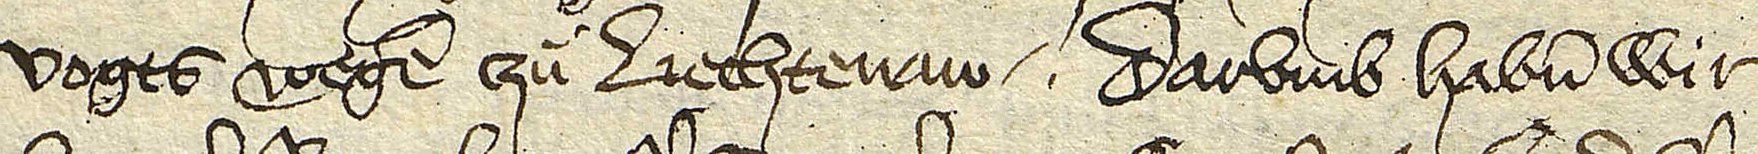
vogts wege* cʒü Liechtenaw / . Darvmb habn* wir
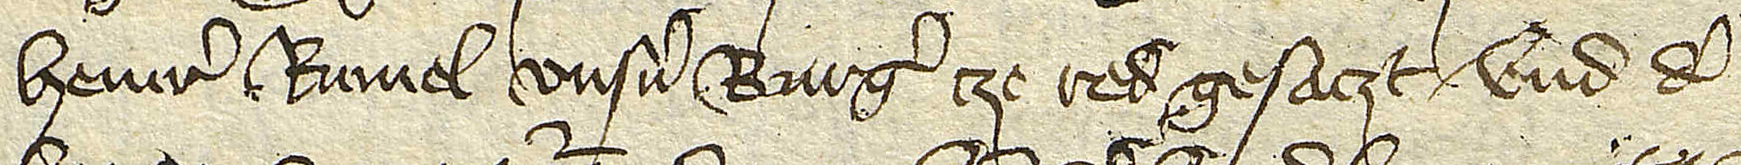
heinr* Rumel vnſn* Burg* cʒe red geſacʒt / vnd d*
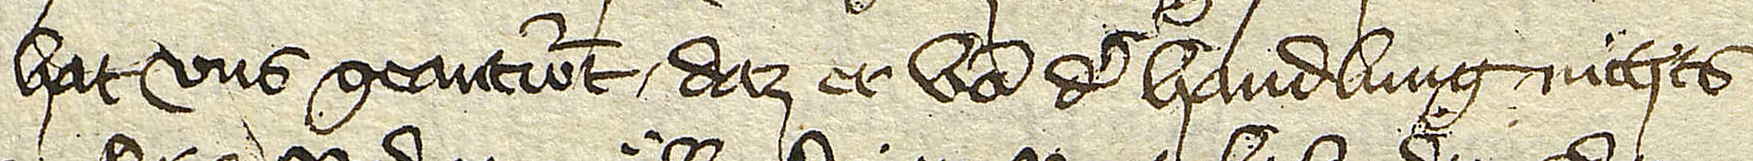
hat vns geantwt* / daʒ er vo* d* handlung nichts
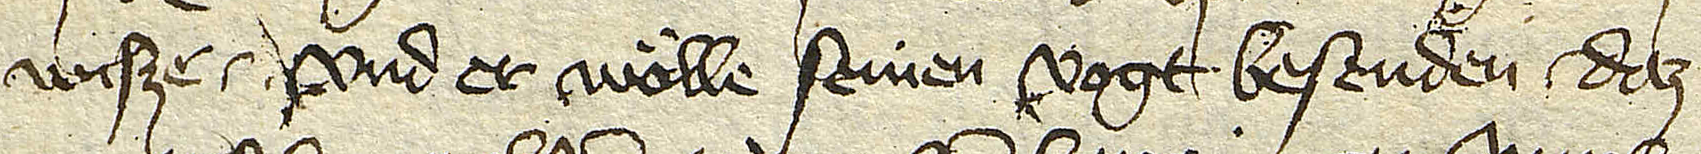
wiſʒe / . vnd er wölle ſeinen vogt beſenden / daʒ
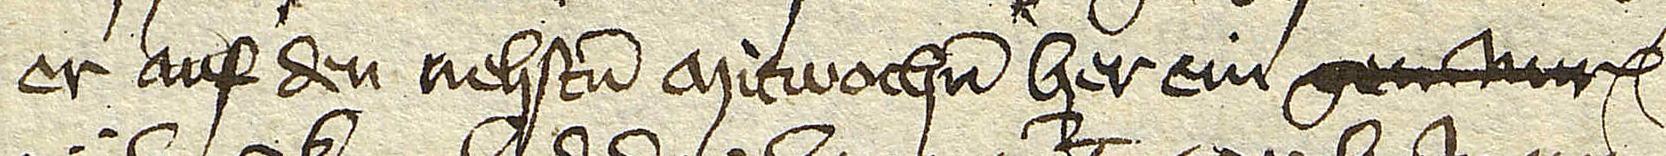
er auf den nehſtn* Mitwochn* herein gen Nur*
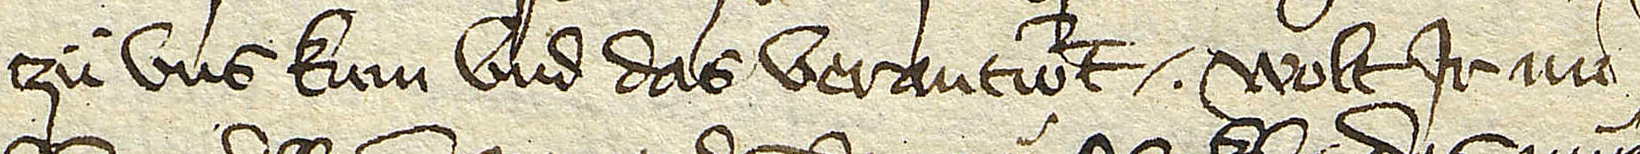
cʒü vns kum vnd das verantwt* / . wolt Ir nu
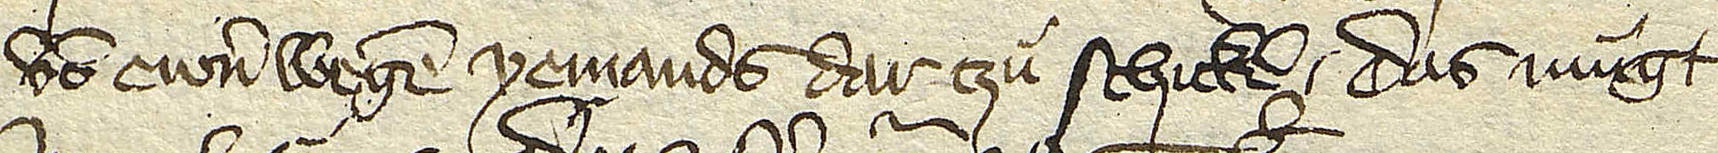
vo* ewn* wege* yemands dar cʒü ſchicke* / Das mügt
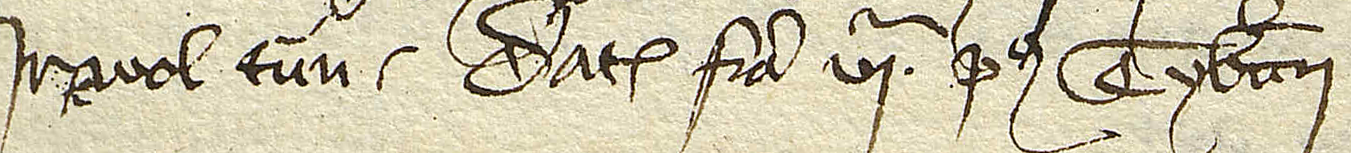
Ir wol tün / Dat* fia* vi* . p* Tybrcii*
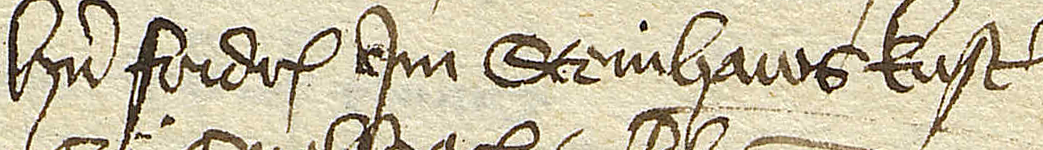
hn* fridr* Im Steinhaws kuſt*
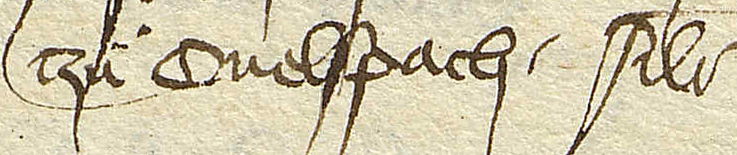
cʒü Onelſpach / ſilr*
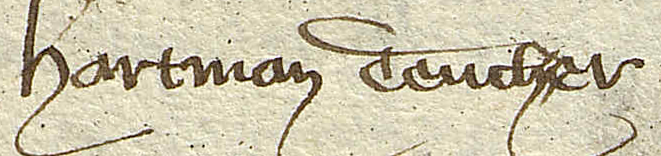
Hartman Teucher
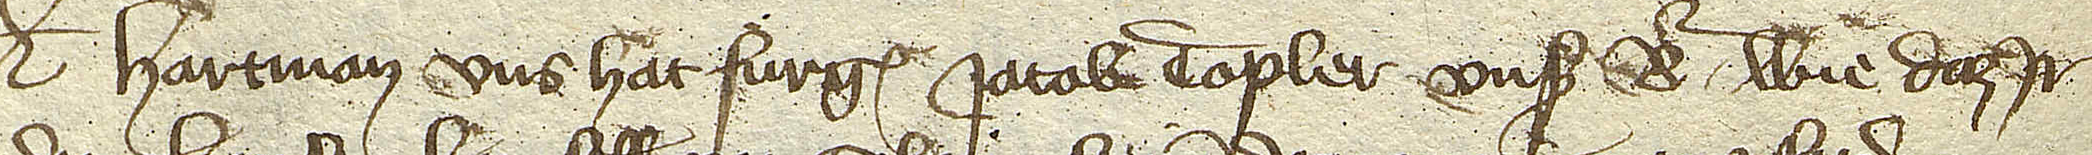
L* Hartman vns hat furg* Iacob Topler vnſ* B* / wie daʒ Ir
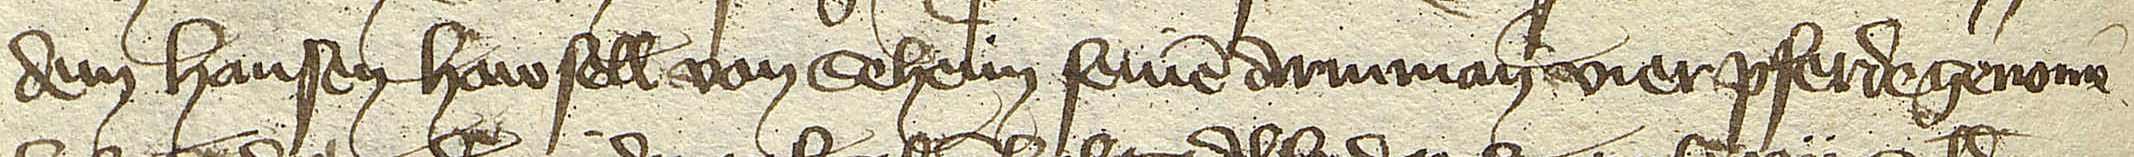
dem hanſen hawſell von Seheim ſeine* Armman vier pferde genome*
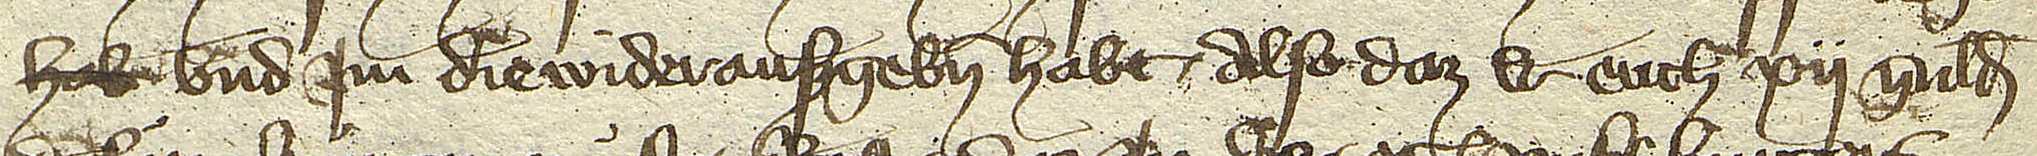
hab vnd Im die widerauſʒgebn* habt / Alſo daʒ Er euch xii guld*
